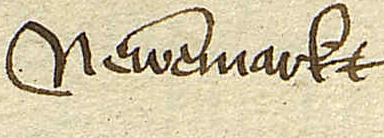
Newe*markt
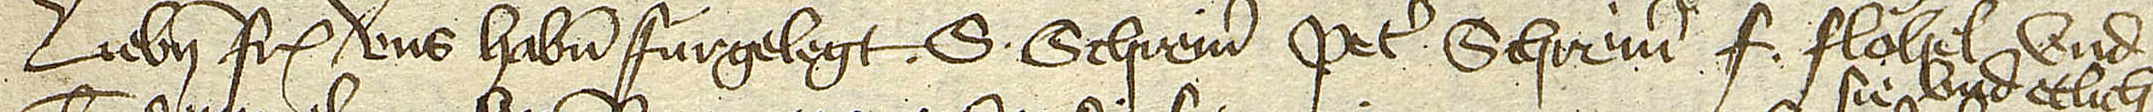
Liebn* fr* / Vns habn* fürgelegt . S . Schrein* Pet* Schrein* f . flöhel vnd
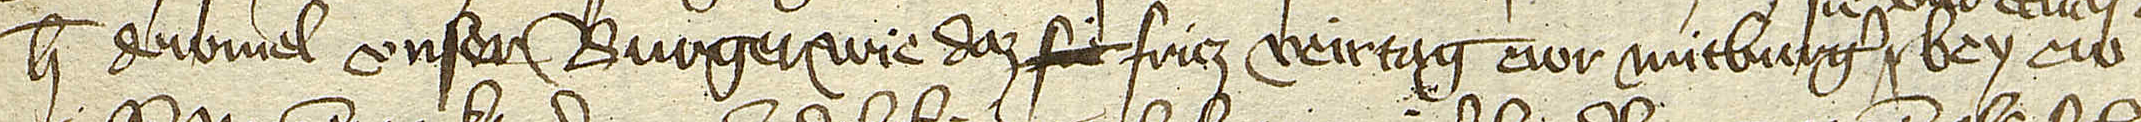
h* dewmel vnſer Burger wie daʒ ſie fricʒ veirtag ewr mitburg* / bey ew
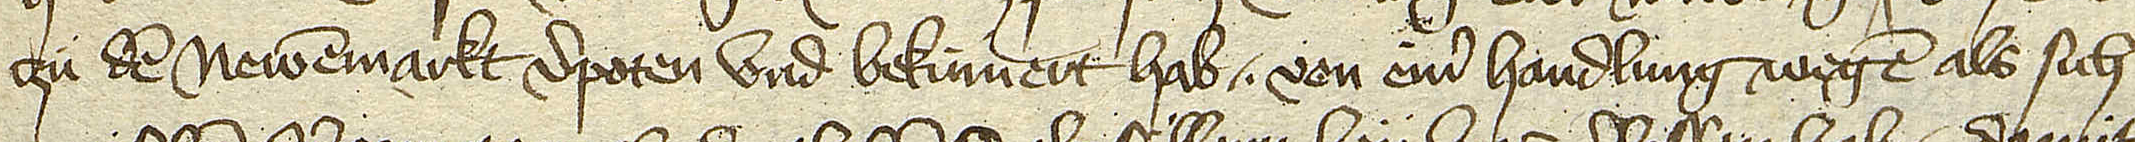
cʒü de* Newe*markt v*poten vnd bekümert hab / . von ein* handlung wege* als ſich
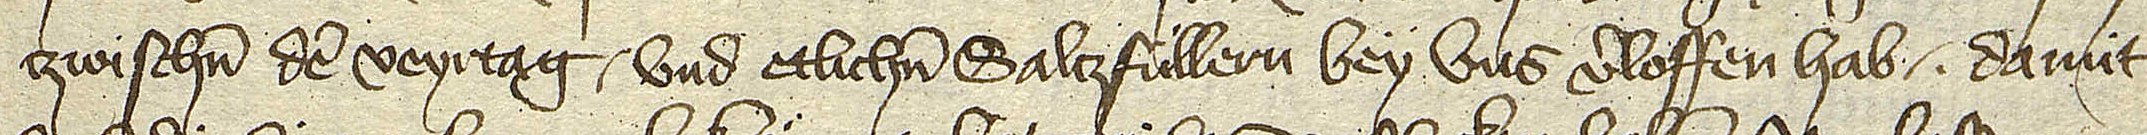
cʒwiſchn* de* veyrtag / vnd etlichn* Salcʒfüllern bey vns v*loffen hab / . damit
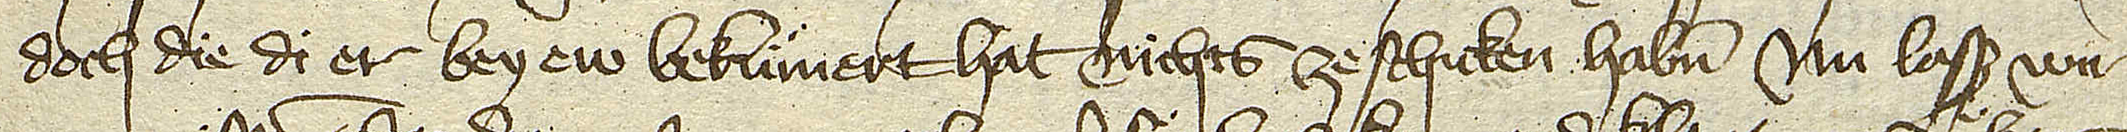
doch die di er bey ew bekümert hat nichts cʒeſchicken habn* Nu laſſ* wir
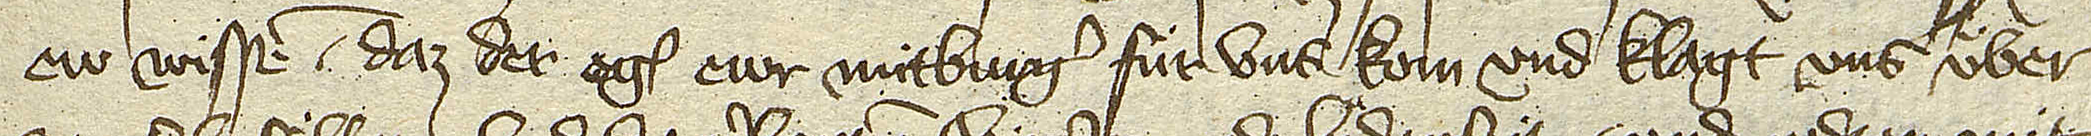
ew wiſſe* / daʒ der eg* ewr mitburg* für vns kom vnd klagt vns v̈ber
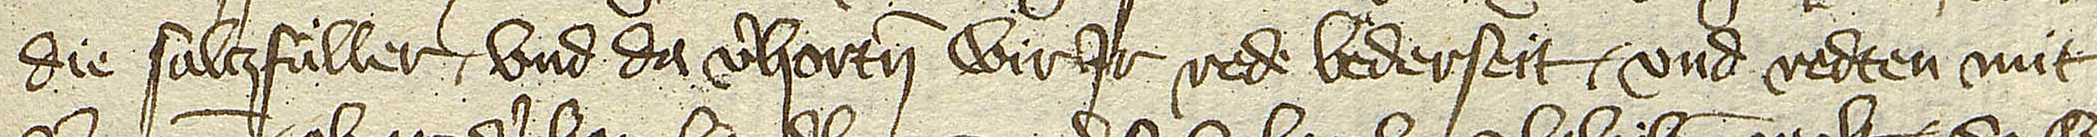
die ſalcʒfüller / vnd da v*hortn* wir Ir rede bederſeit / vnd redten mit
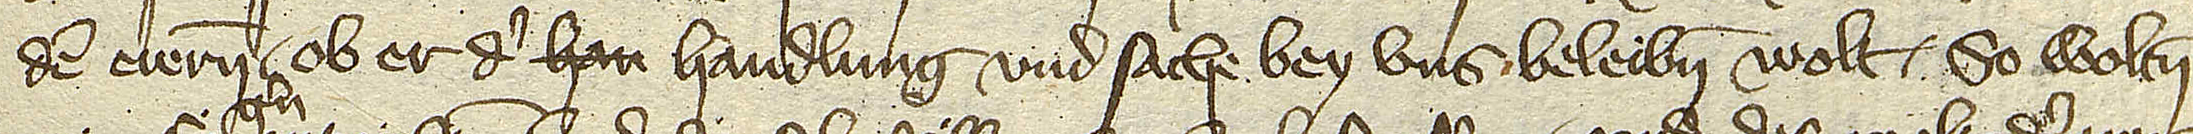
de* ewrn* / ob er d* han handlung vnd ſache bey vns beleibn* wolt / So woltn*
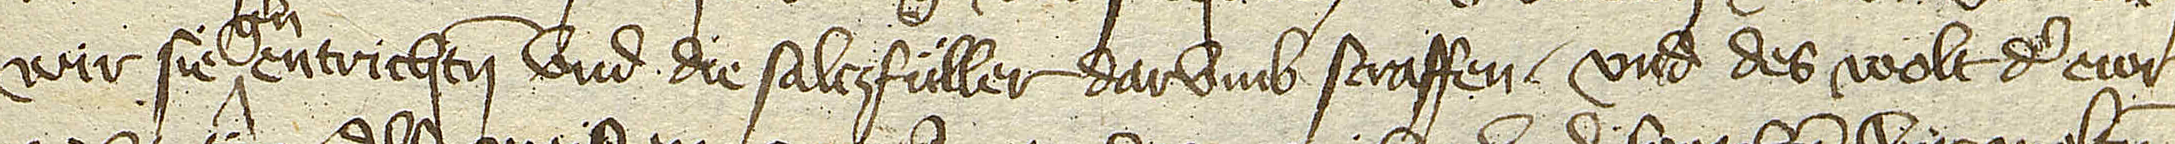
wir ſie entrichtn* vnd die ſalcʒfüller darvmb ſtraffen / vnd des wolt d* ewr
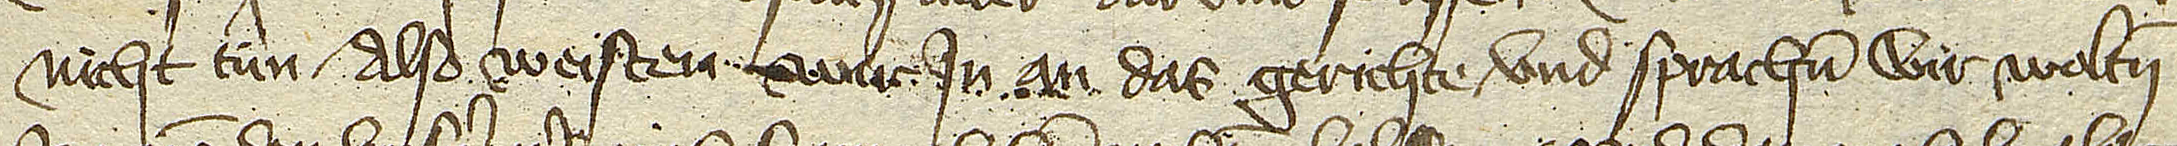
nicht tün / Alſo weiſten wir In an das gerichte / vnd ſprachn* wir woltn*
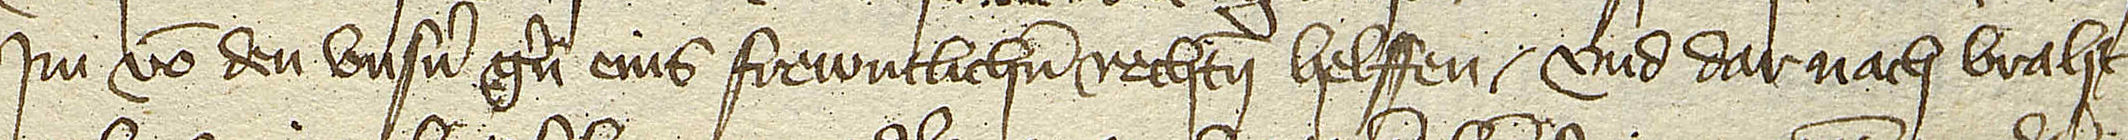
Im vo* den vnſn* g*n eins frewntlichn* rechtn* helffen / vnd dar nach braht
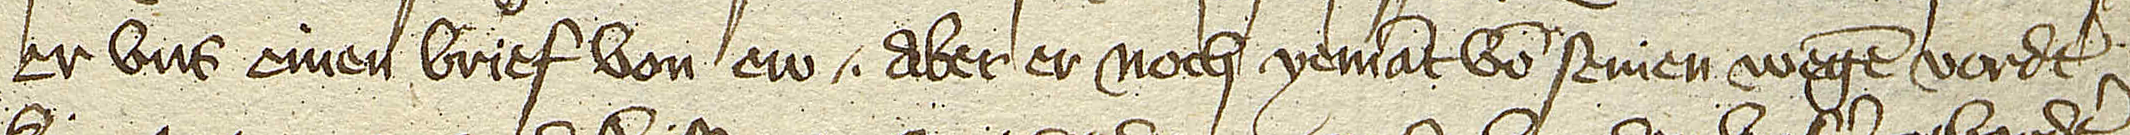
er vns einen brief von ew / . aber er noch yemat* vo* ſeinen wege* vordt*
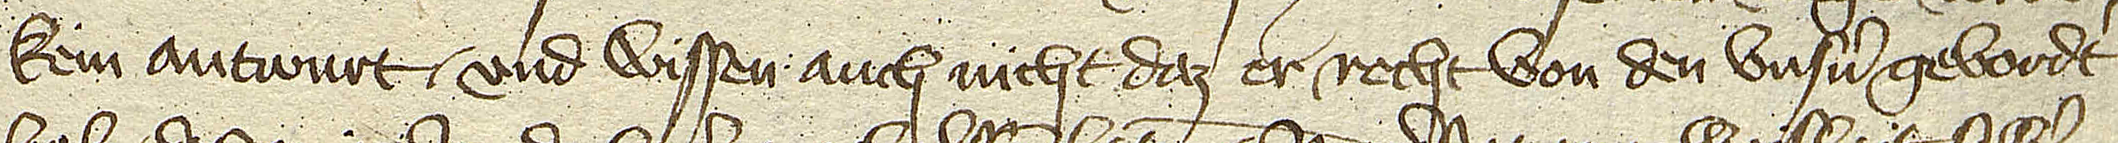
kein antwurt / vnd wiſſen auch nicht daʒ er recht von den vnſn* gevordt*
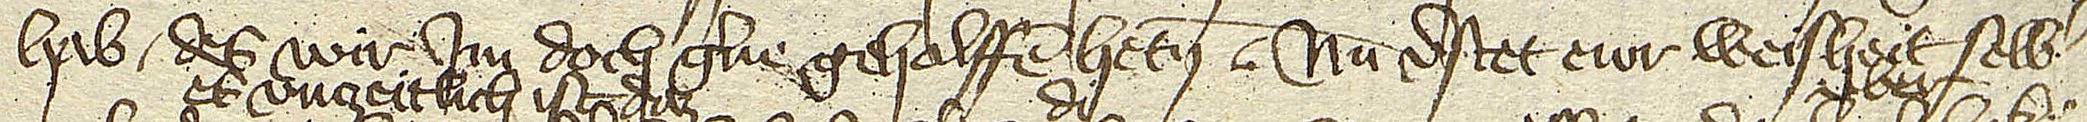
hab / des wir Im doch g*ne geholffe* hetn* / . Nu v*ſtet ewr weiſheit ſelb*
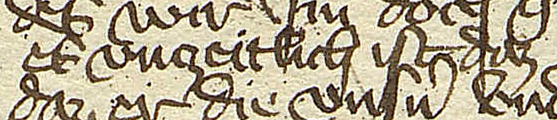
es vncʒeitlich iſt daʒ
